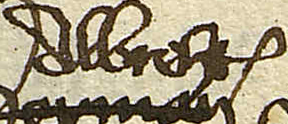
Albreht*
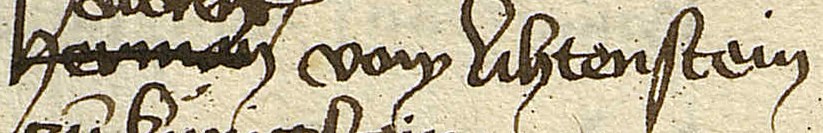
Herman von Lichtenſtein
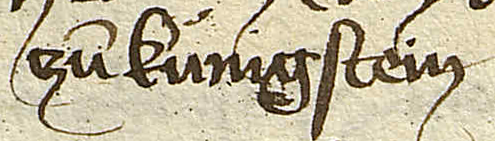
cʒu* künigſtein
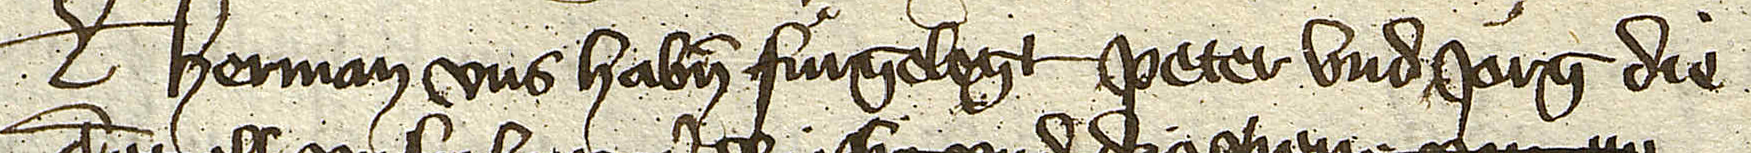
L* Herman vns habn* fürgelegt Peter vnd Iörg die
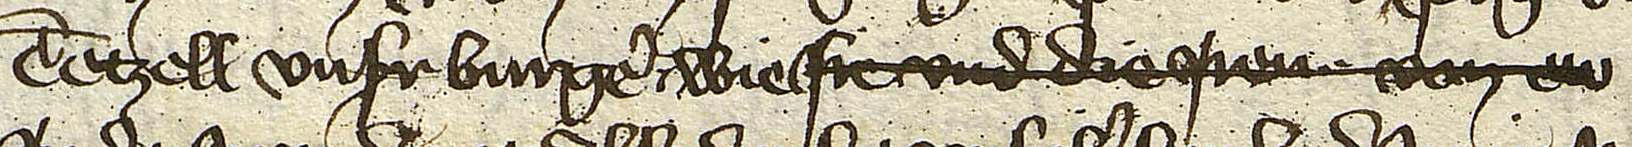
Tecʒell vnſ*r burge* / wie ſie vnd die Iren ~ von ew
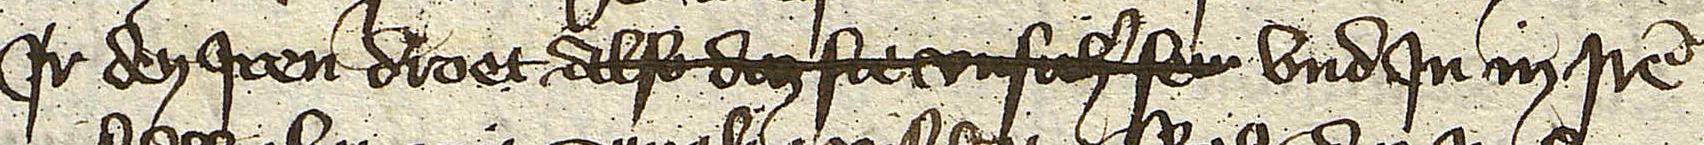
Ir den Iren droet / Alſo daʒ ſie vnſich* ſein vnd In in Ire*
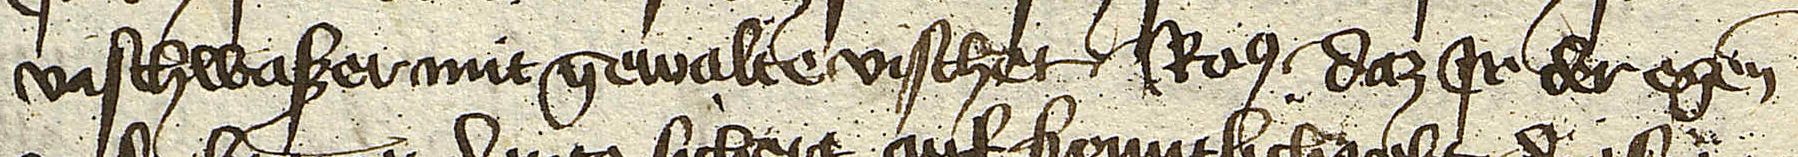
viſchwaſʒer mit gewalte viſchet / Ro* / daʒ Ir der egen*
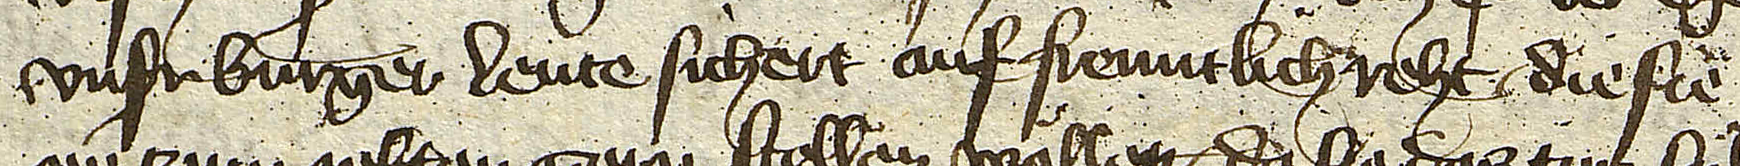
vnſ*r burger leute ſichert auf freuntlich reht / die ſie
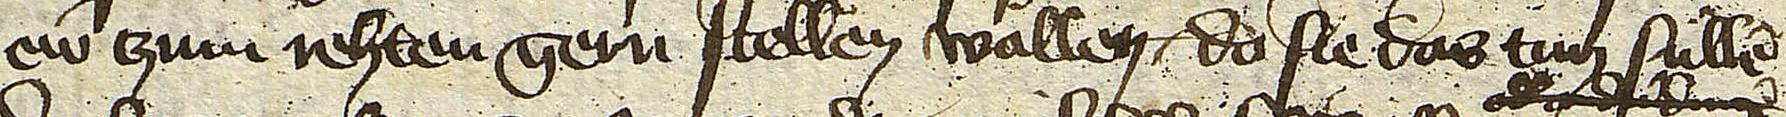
ew cʒum rehten gern ſtellen wöllen / do ſie das tun ſülle*
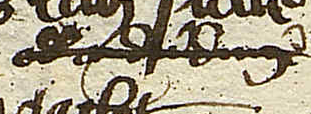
od* andn* dinge*
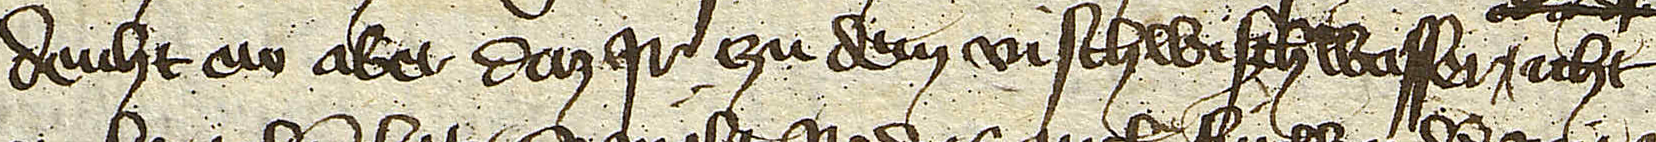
deuht ew aber daʒ Ir cʒu dem viſchwiſʒch waſſer icht
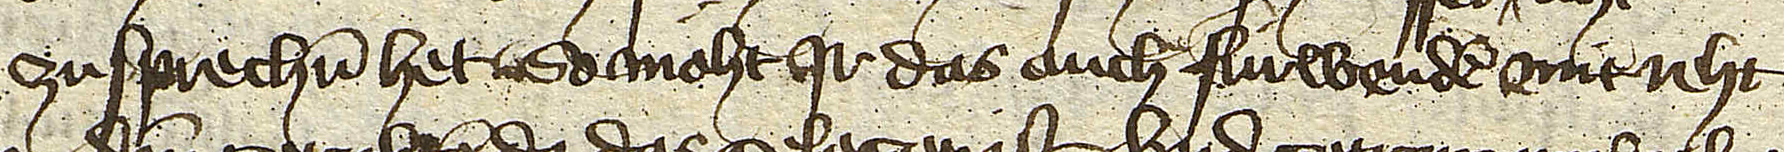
cʒu ſprechn* het / So möht Ir das auch fürwende* mit reht
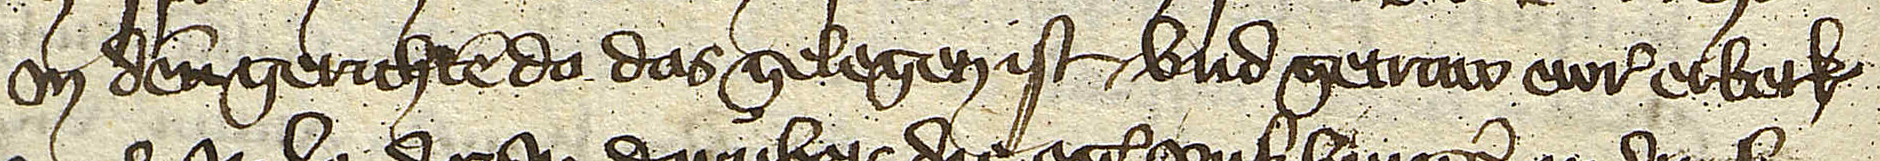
in den* gerichte* da das gelegen iſt / vnd getraw ewr* erberk*
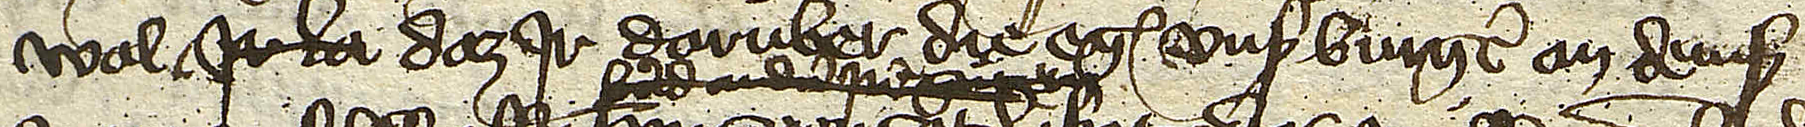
wol / Ir la daʒ Ir darüber die eg* vnſ* burge* an demſ*
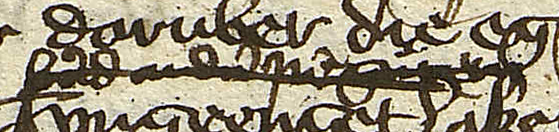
vnd andn* Ire* guten
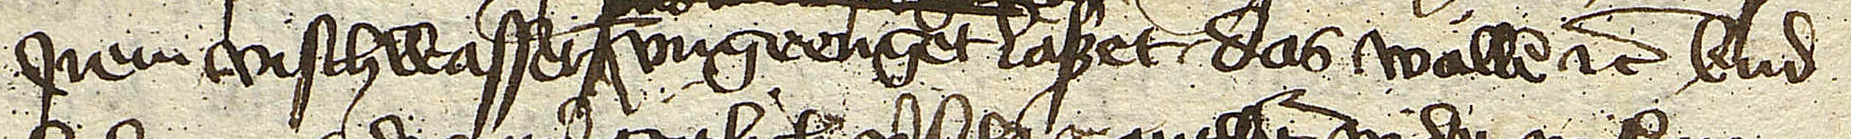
Iren viſchwaſſer vngeenget laſʒet / das wölle* ec* vnd
